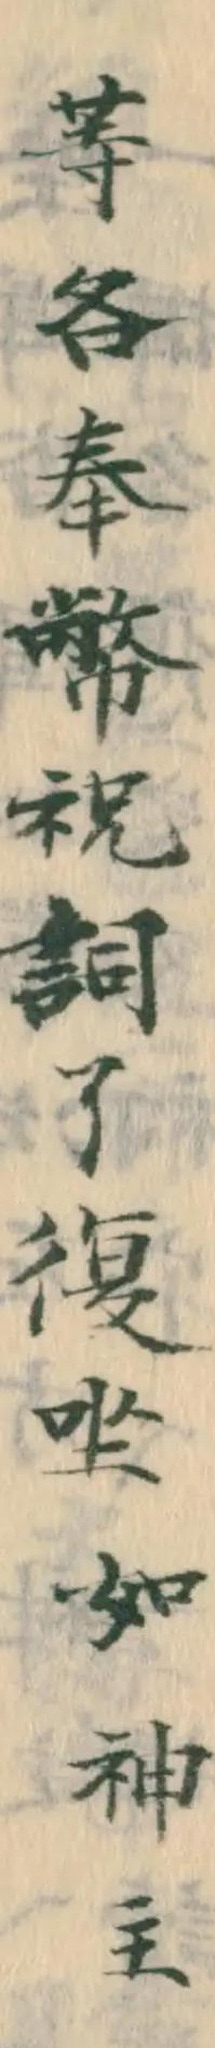等各奉幣祝詞了復坐如神主
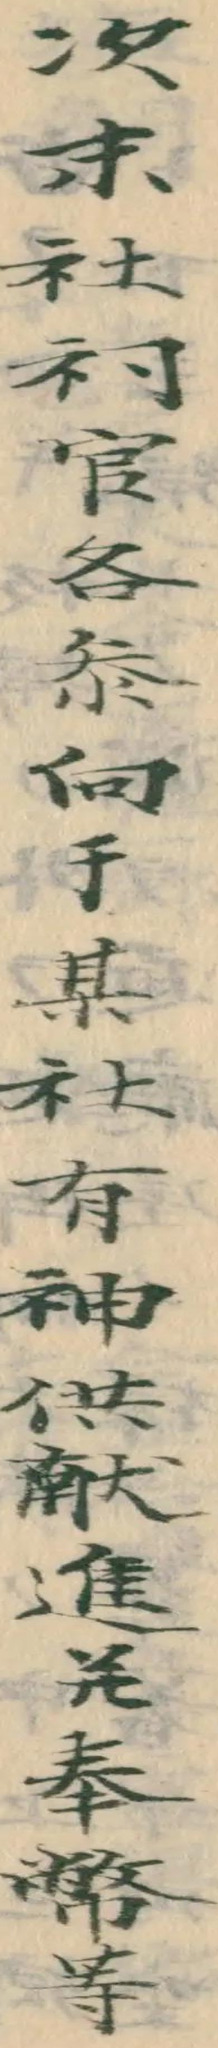次末社祠官各参向于某社有神供献進并奉幣等

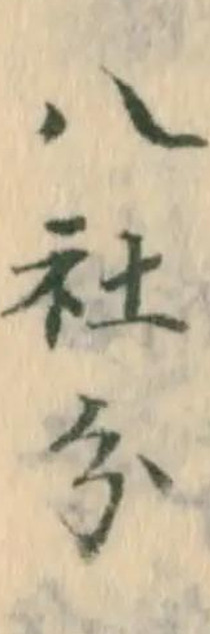八社分
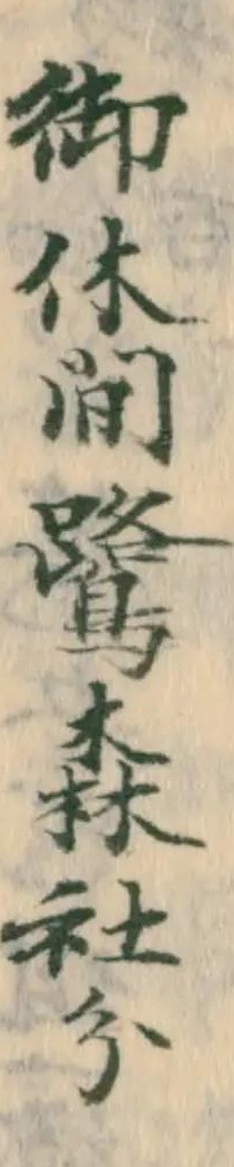御休間鷺森社分
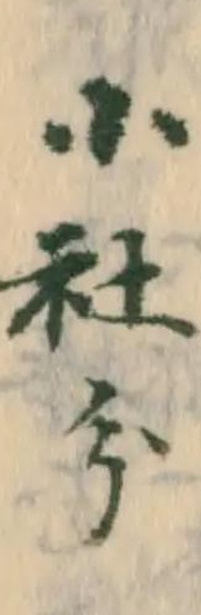小社分
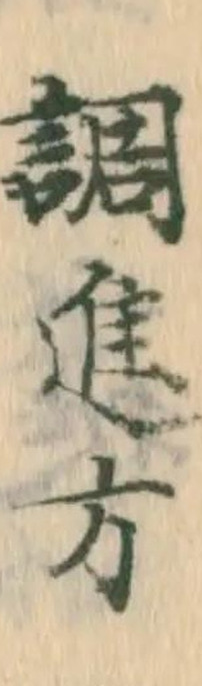調進方

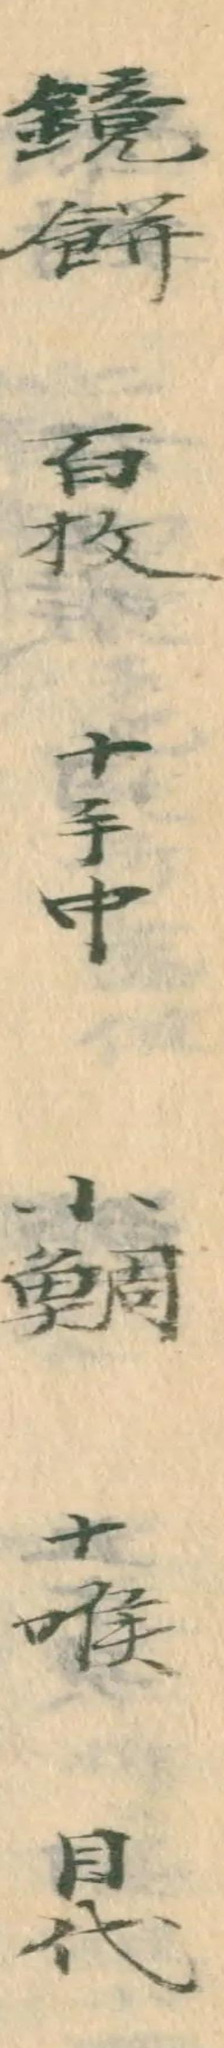鏡餅百枚十手中小鯛十喉目代
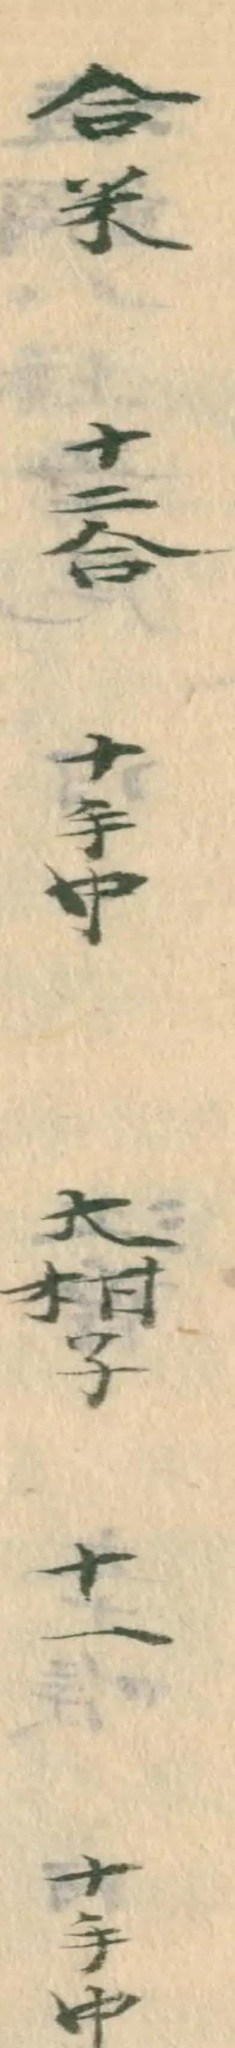合米十二合十手中大柑子十一十手中
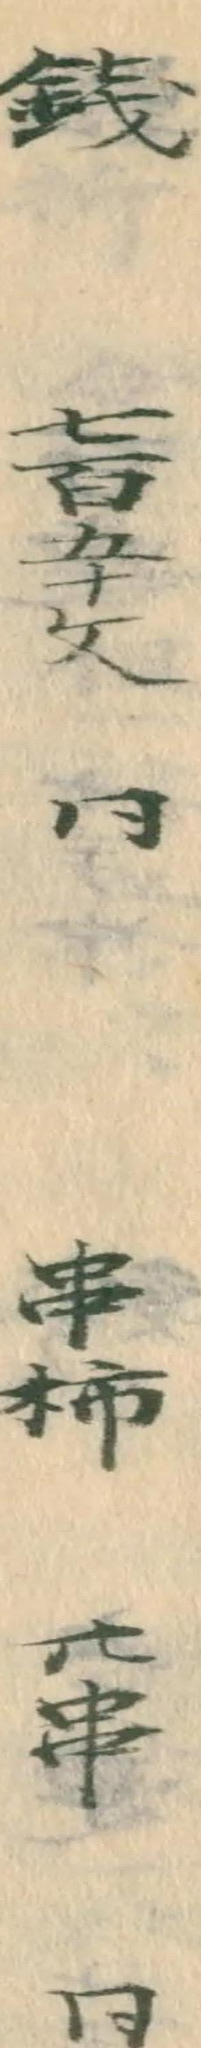銭七百五十文同串柿廿串同
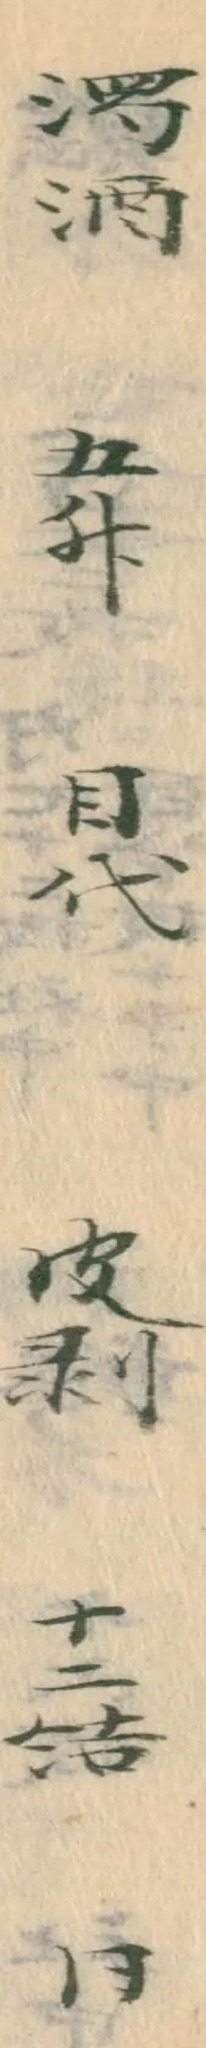濁酒五升目代皮剥十二結同
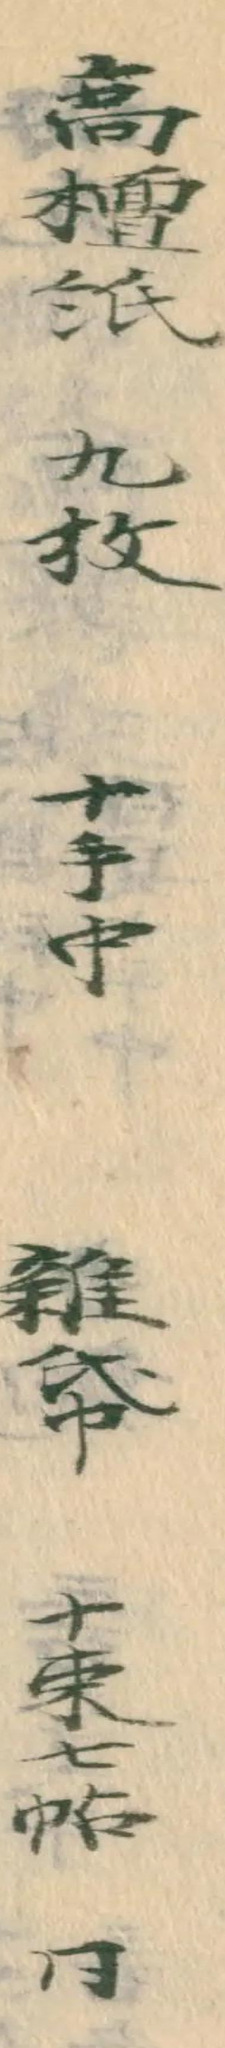高檀紙九枚十手中雑紙十束七帖同
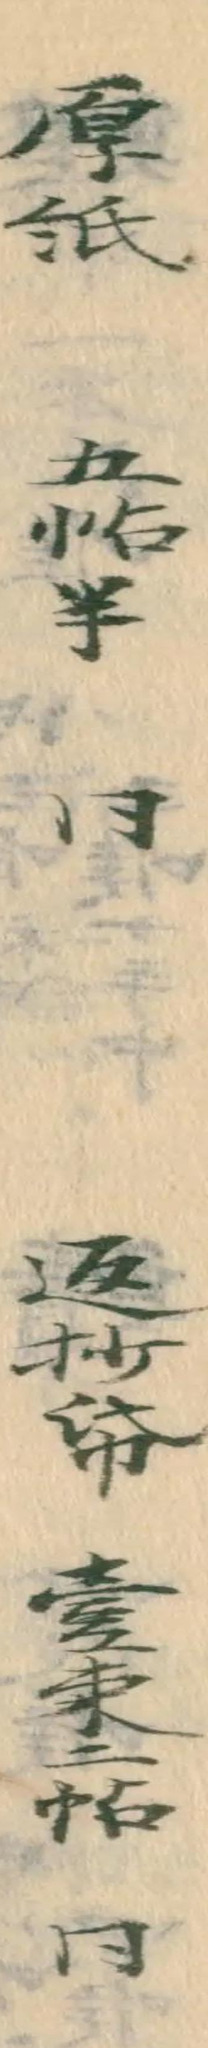厚紙五帖半同返抄紙壱束二帖同
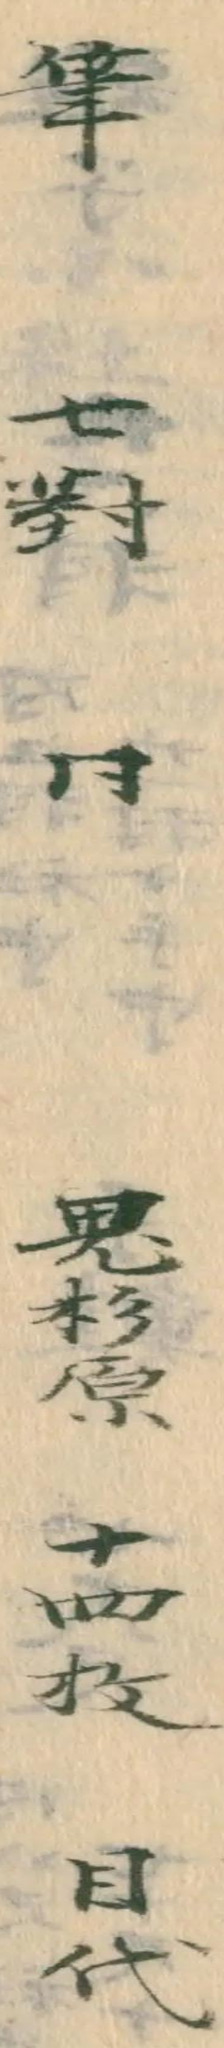筆七対同鬼杉原十四枚目代
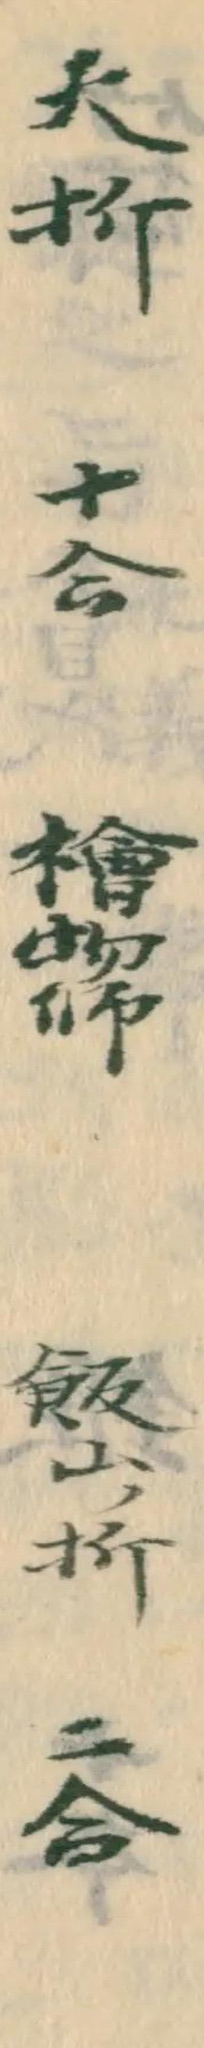大折十合檜物師飯山ノ折二合
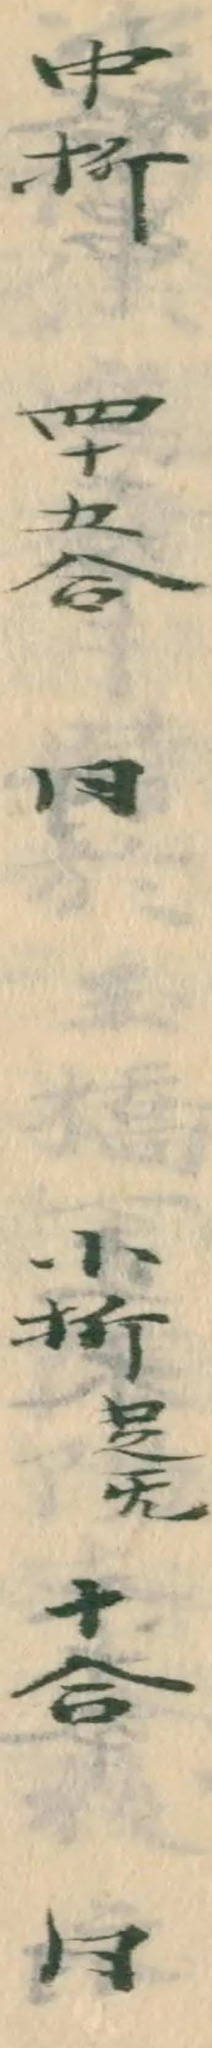中折四十五合同小折足無十合同
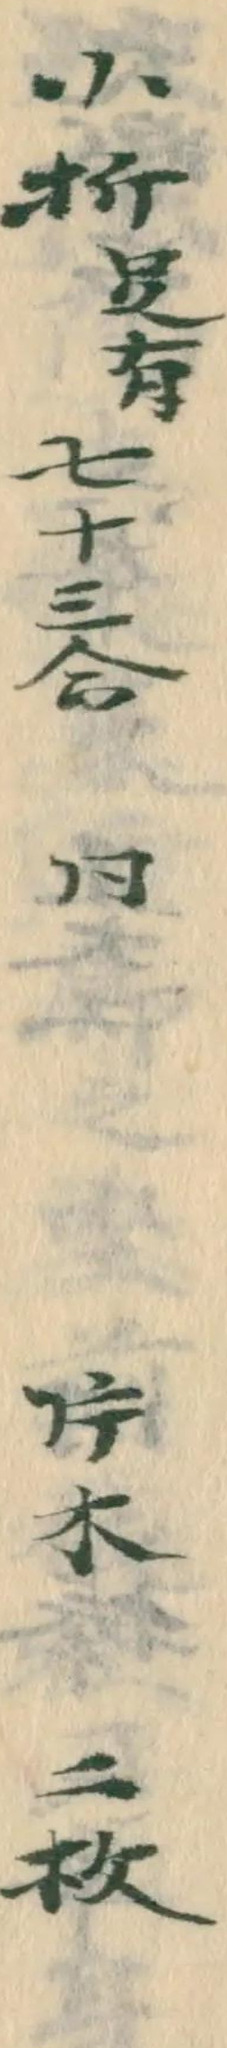小折足有七十三合同片木二枚
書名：賀茂社記録. 第5冊
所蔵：国立国会図書館 National Diet Library, JAPAN
